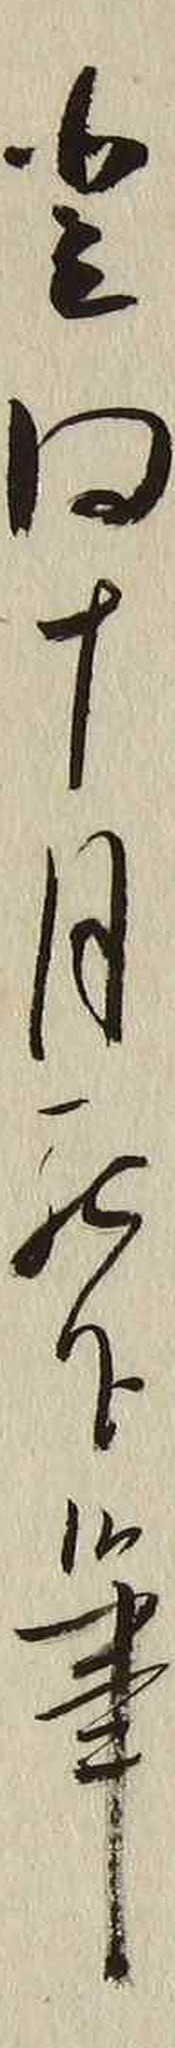登同十月罷下候事
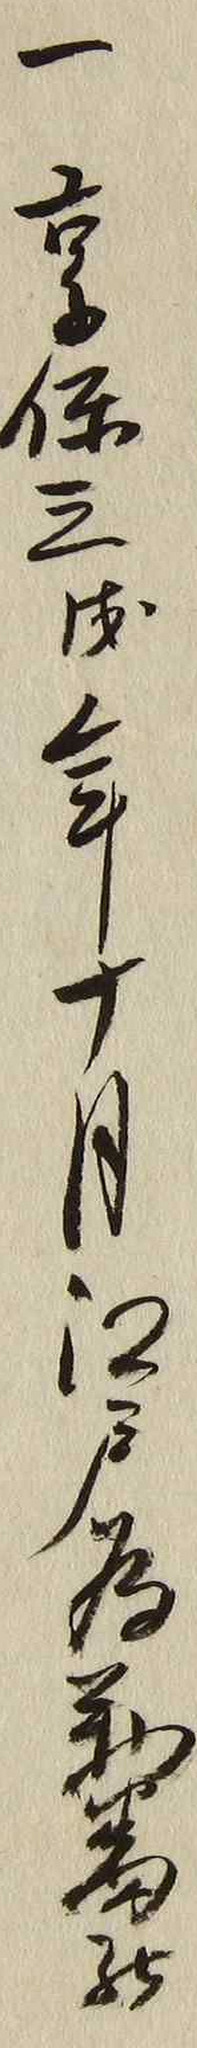一享保三戌年十月江戸為勤番罷
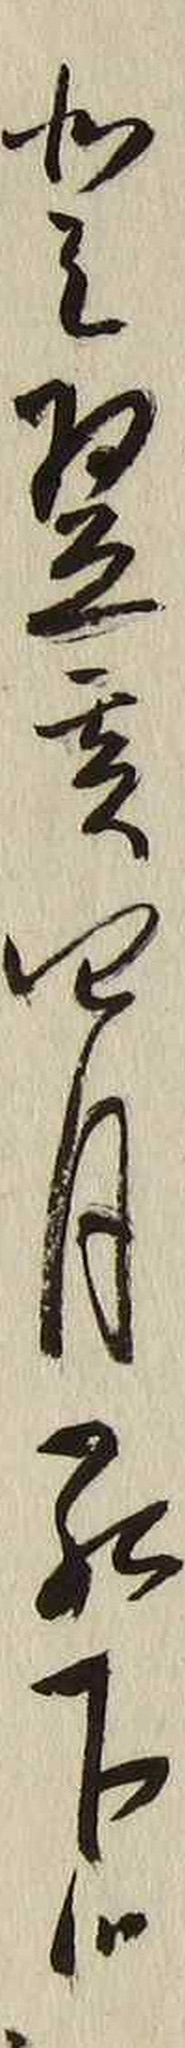登翌亥四月罷下候
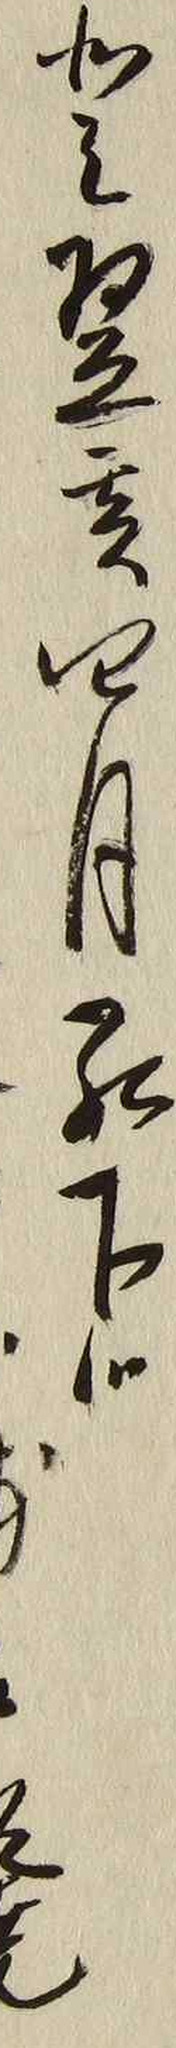登翌亥四月罷下候
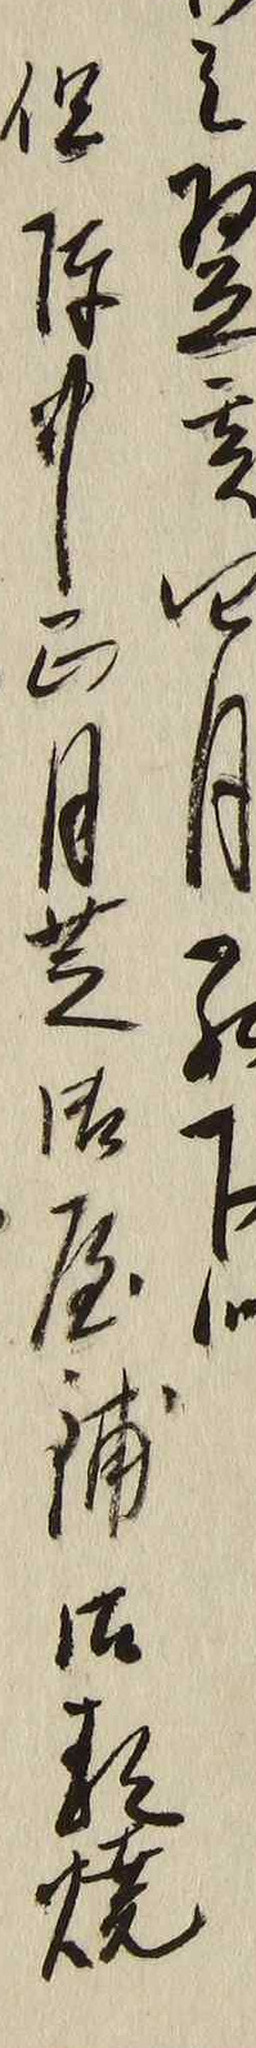但陣中正月芝御屋鋪御類焼
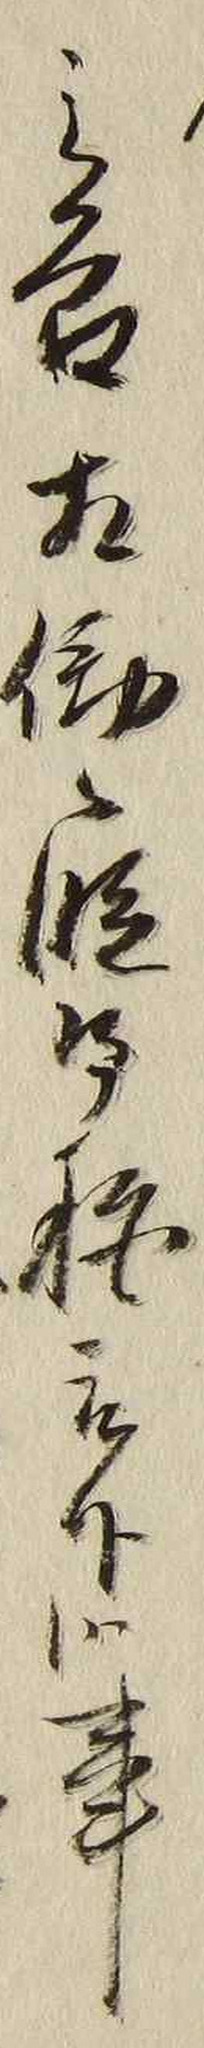之節相働候段御称被下候事
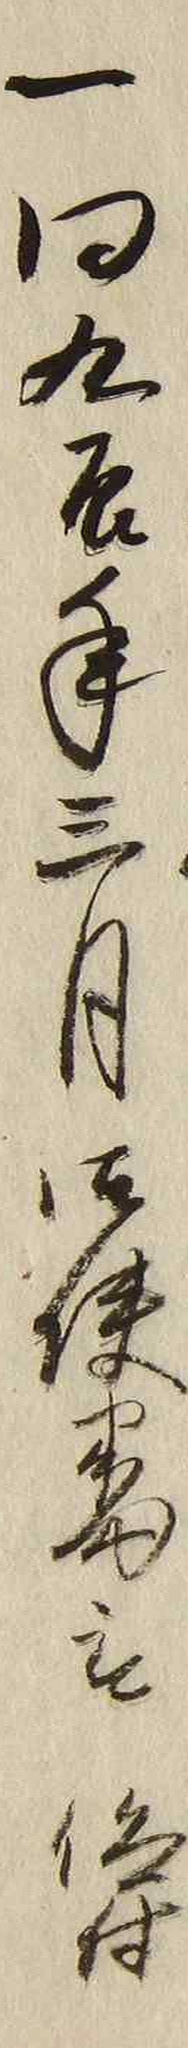一同九辰年三月御使番被仰付

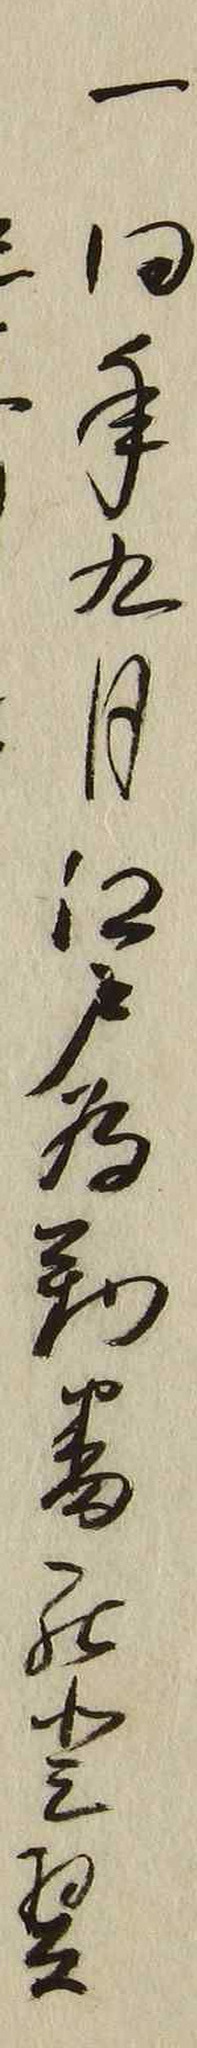一同年九月江戸為勤番罷登翌
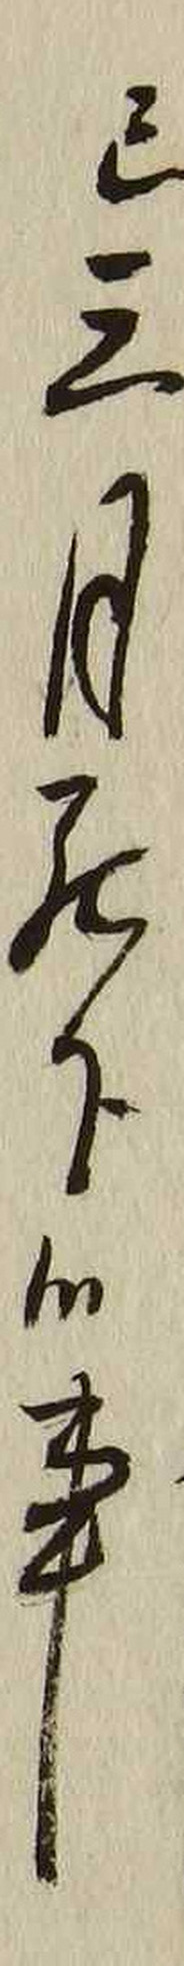巳三月罷下候事
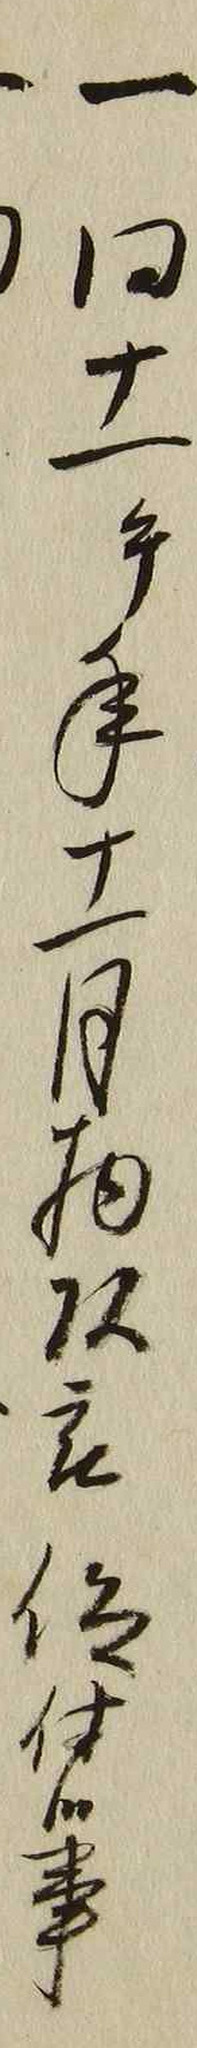一同十一午年十一月物頭被仰付候事
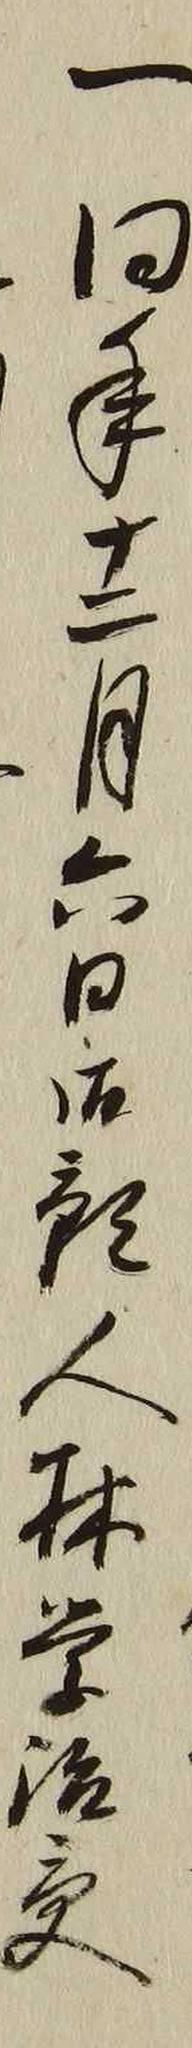一同年十二月六日御預人林学治受
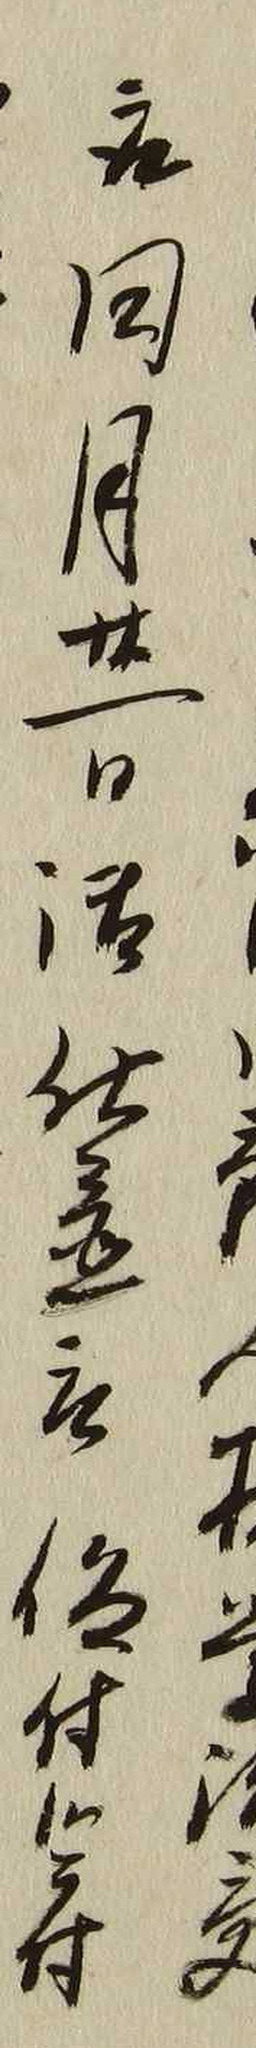取同月廿一日御仕置被仰付候ニ付
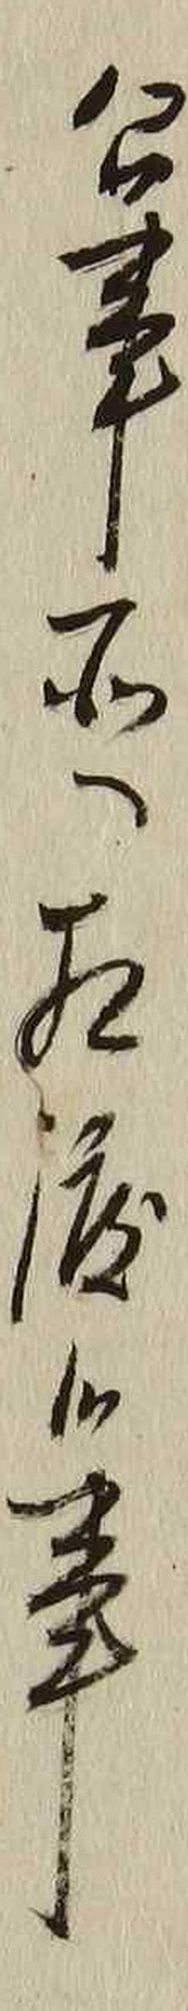公事所へ相渡候事
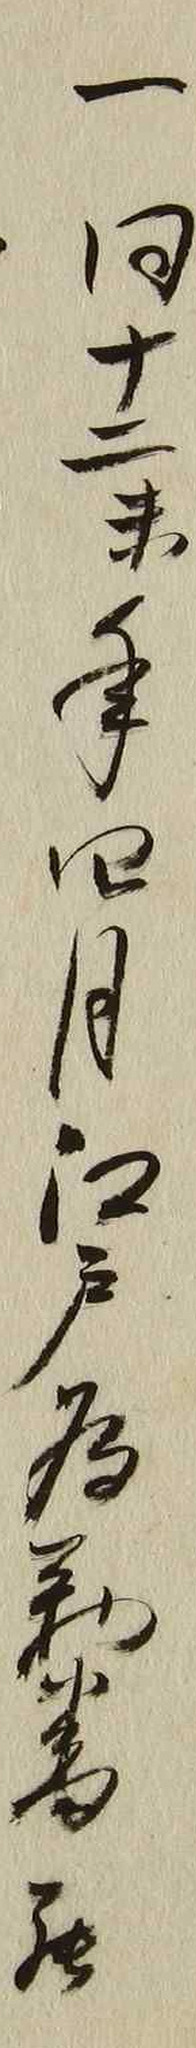一同十二未年四月江戸為勤番罷
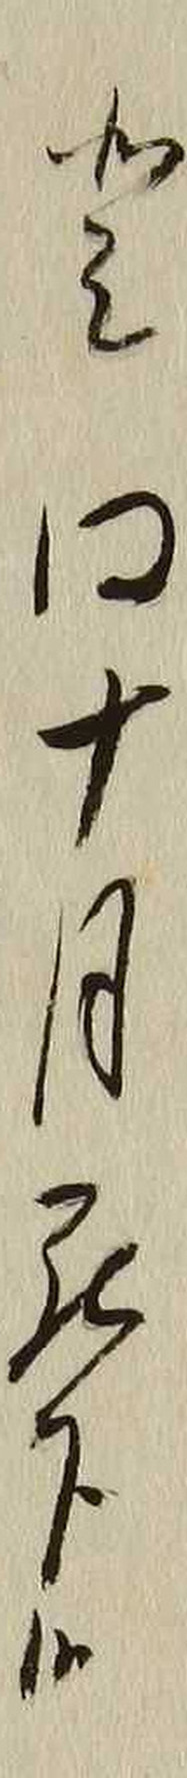登同十月罷下候
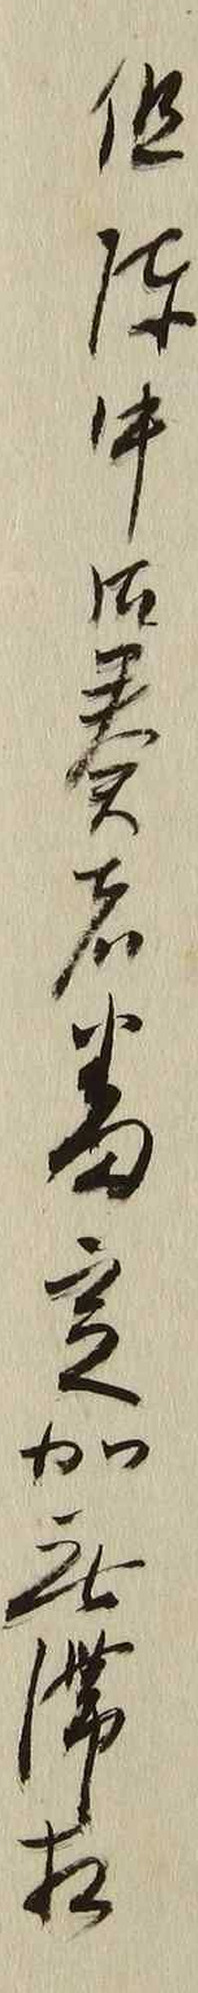但陣中御奏者番定加無滞相
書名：諸士系譜　巻之349　も之部5
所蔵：会津若松市立会津図書館
